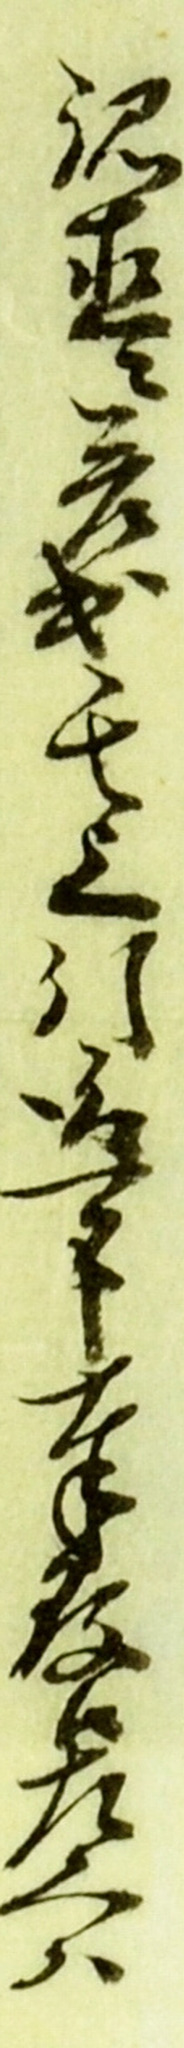認直ニ差出其上引取可申奉存候左候へハ
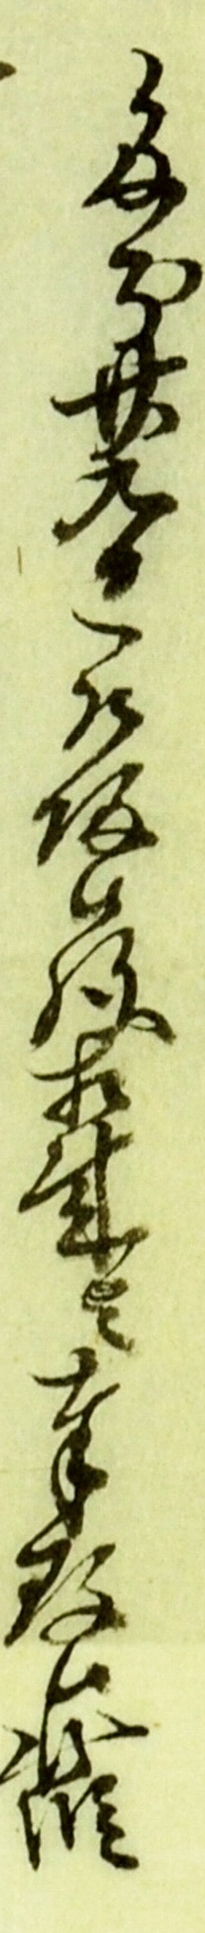多分廿九日罷帰候様相成与奉存候此段
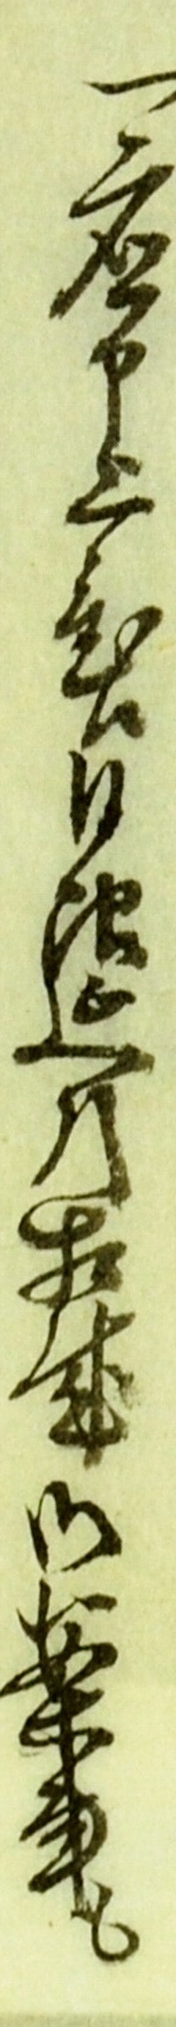一応申上置候日限延引相成御案事も
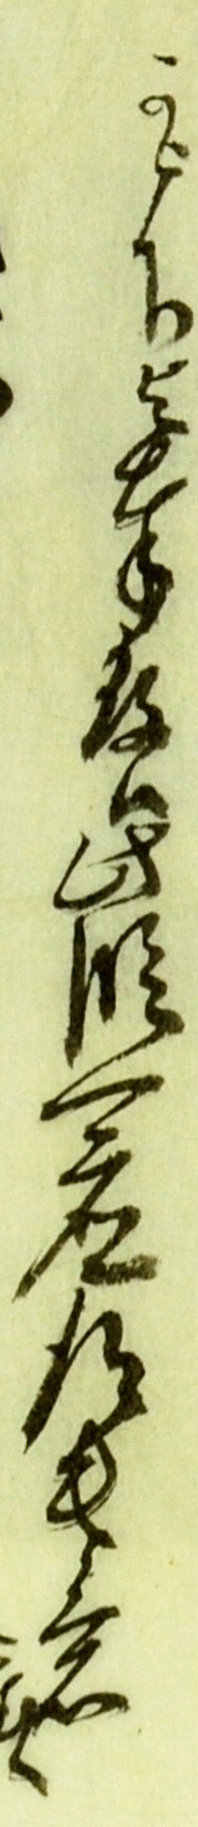可被下与奉存候此段一応得其意置候
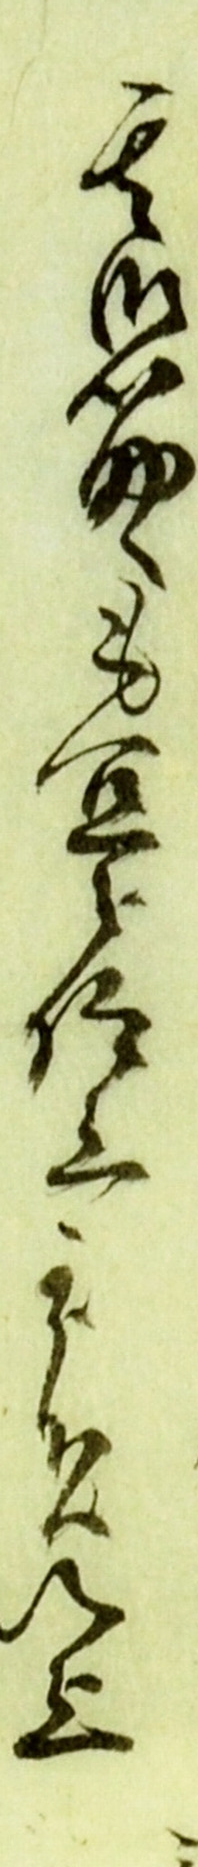其筋へも宜被仰上可被下候以上
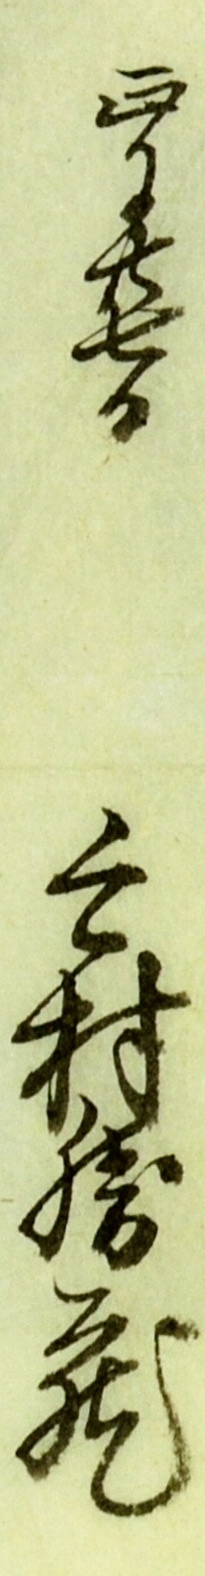正月廿七日今村勝蔵
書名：書状
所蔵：伊那市立高遠町図書館・合同会社AMANE
